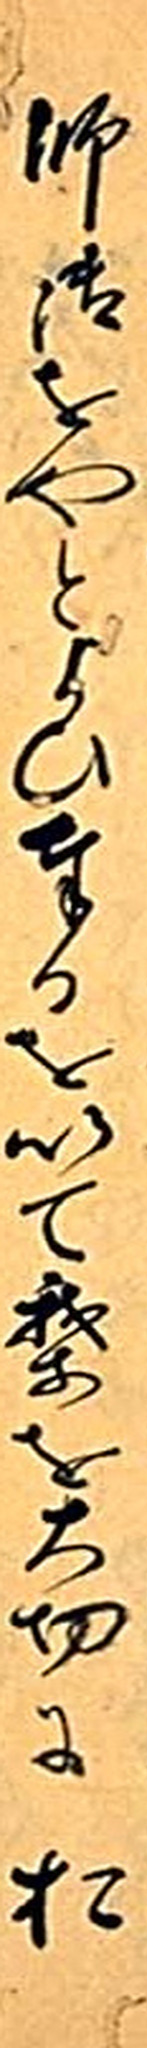師御をやとよひ奉るを以て我等を大切にお
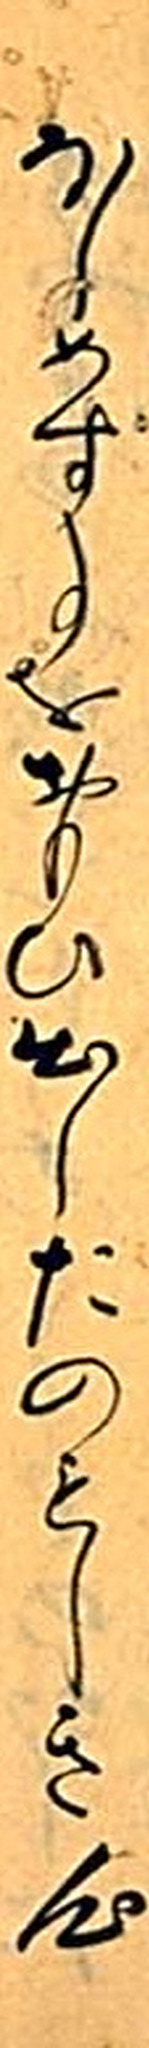ほしめす事をおもひ出したのもしき心
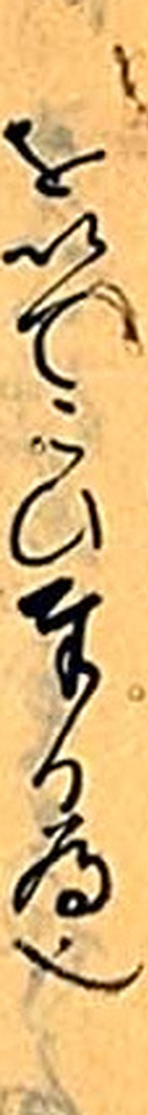を以てこひ奉る為也
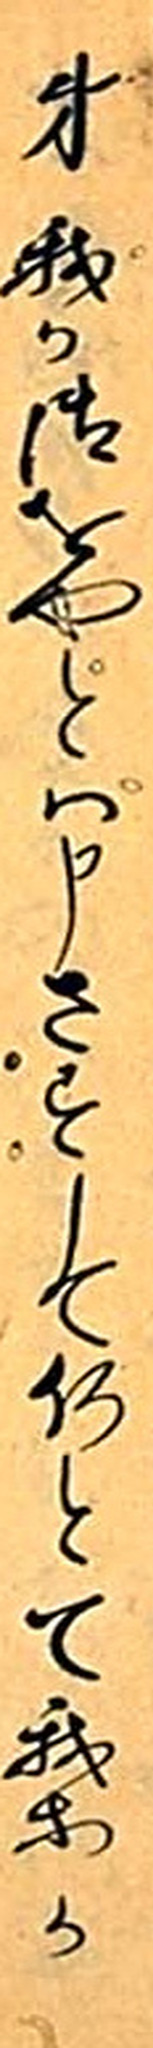弟我か御をやとは申さすして何とて我等か
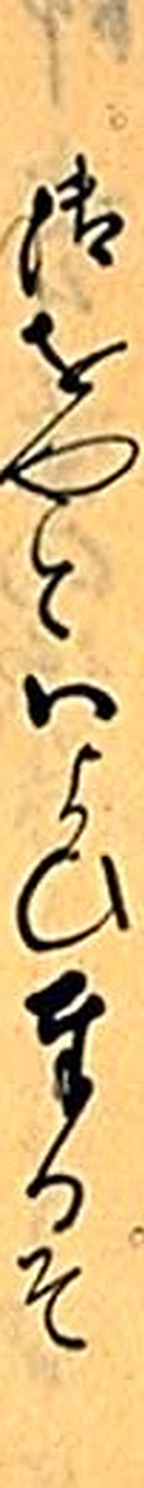御をやとはよひ奉るそ
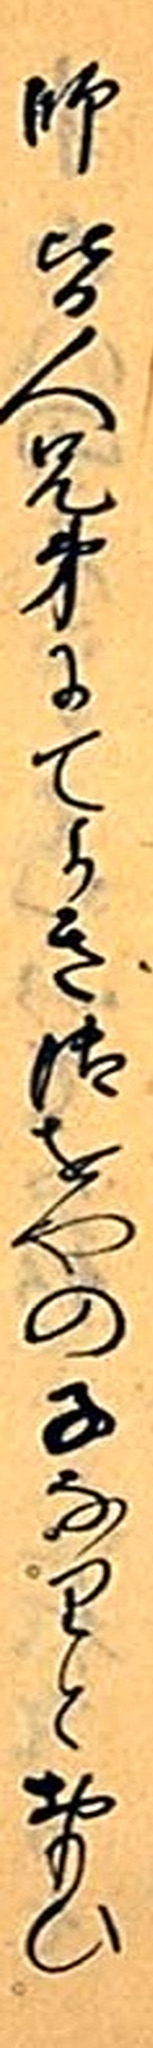師皆人兄弟にてよき御をやの子なりとおもひ
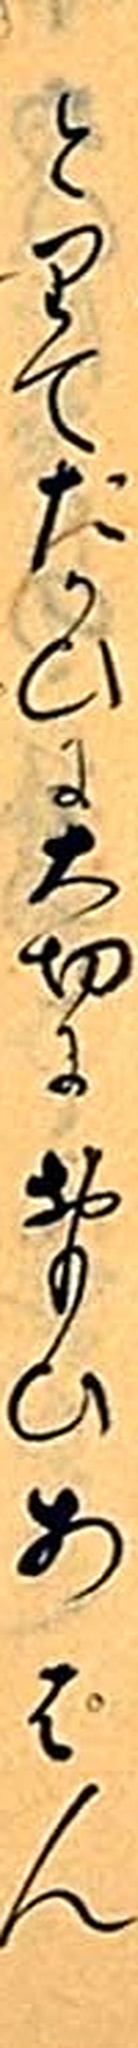とりてたかひに大切におもひあはん
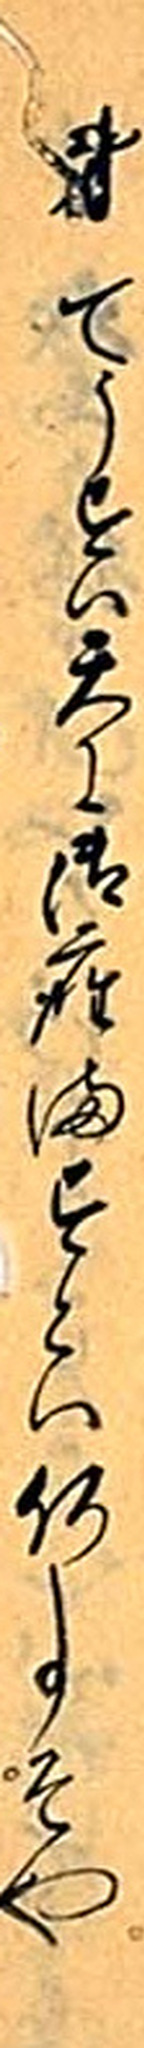弟てうすは天に御座ますとは何事そや
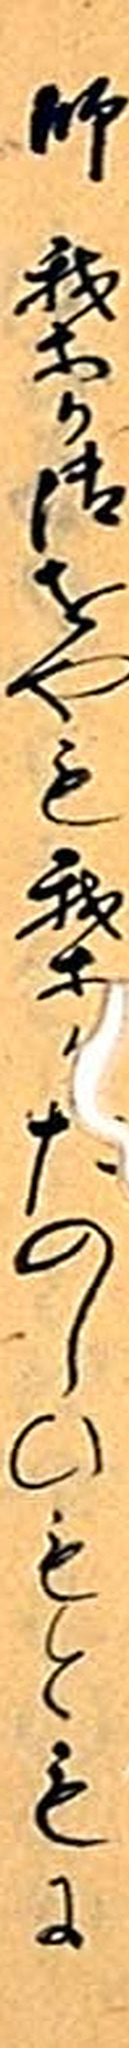師我等か御をやも我等たのしひもともに
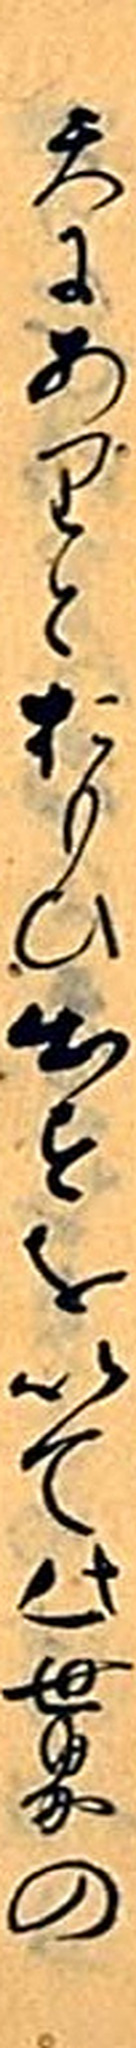天にありとおもひ出すを以て此世界の
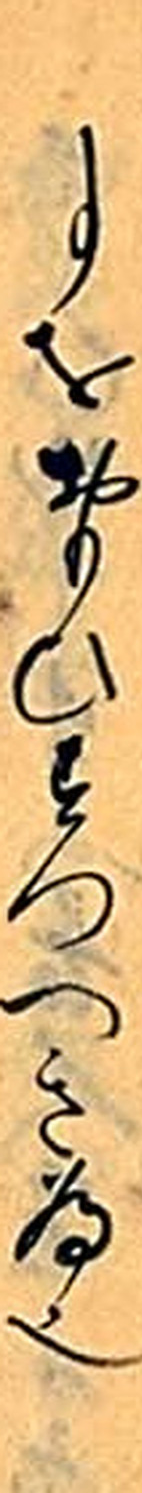事をおもひすつへき為也
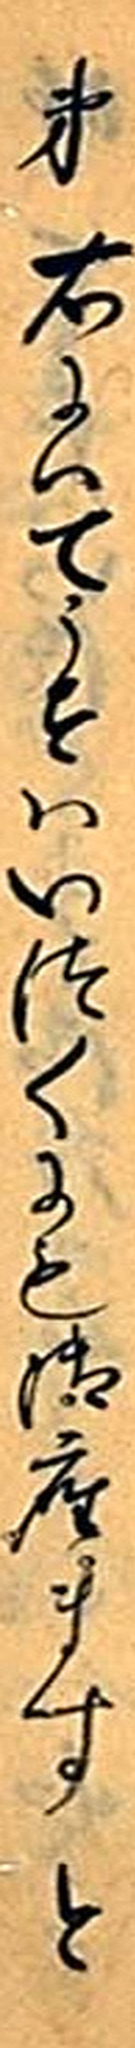弟右にはてうすはいつくにも御座ますと
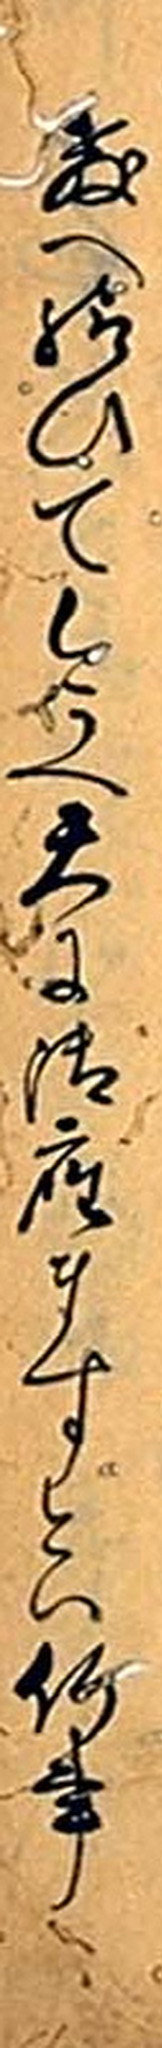教へ給ひて今又天に御座ますとは何事

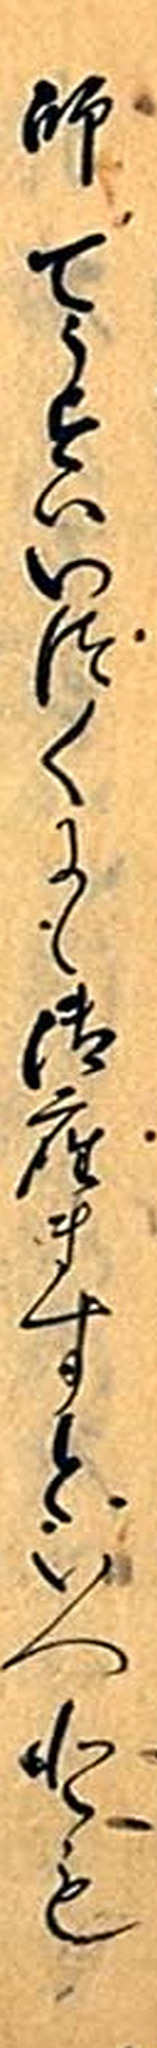師てうすはいつくにも御座ますといへとも
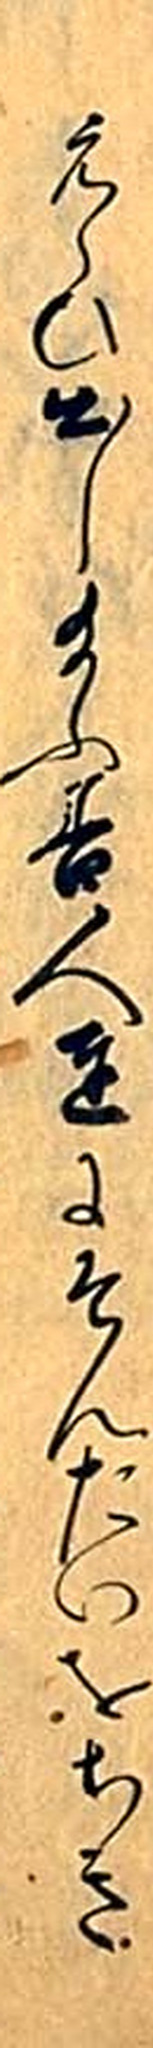えらひ出し給ふ善人達にそんたいをちき
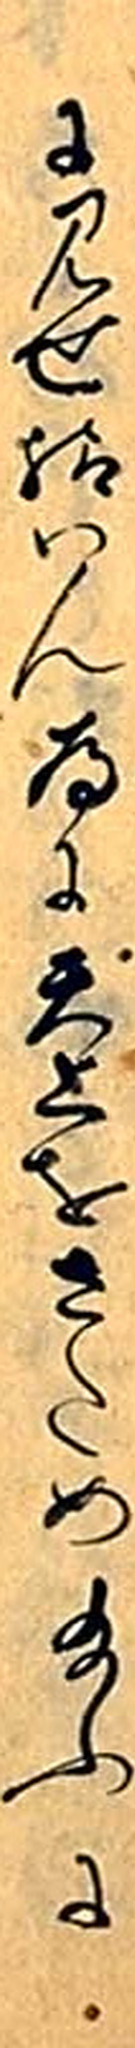に見せ給はん為に天上をさため給ふに
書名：ドチリナ・キリシタン
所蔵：東京大学総合図書館 / General Library in the University of Tokyo
